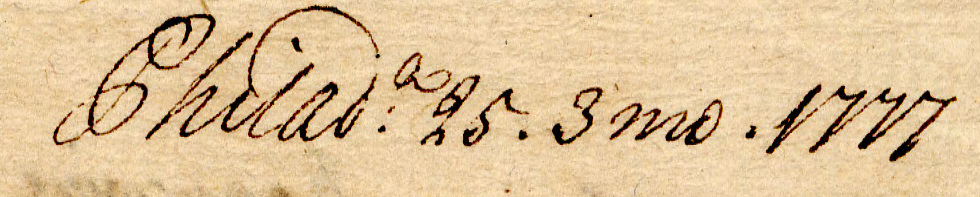Philad^a: 25. 3 mo. 1777
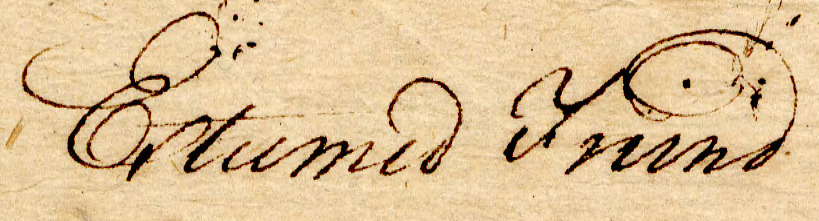Esteemed Friend
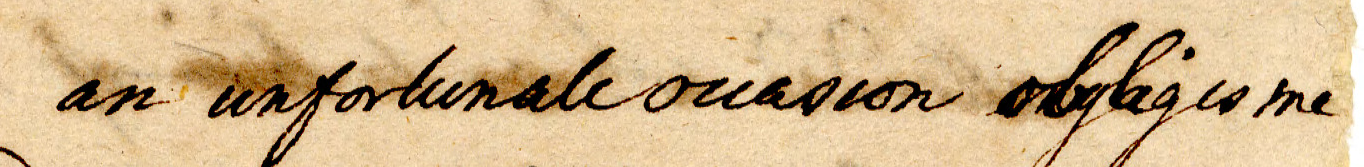an unfortunate occasion obliges me
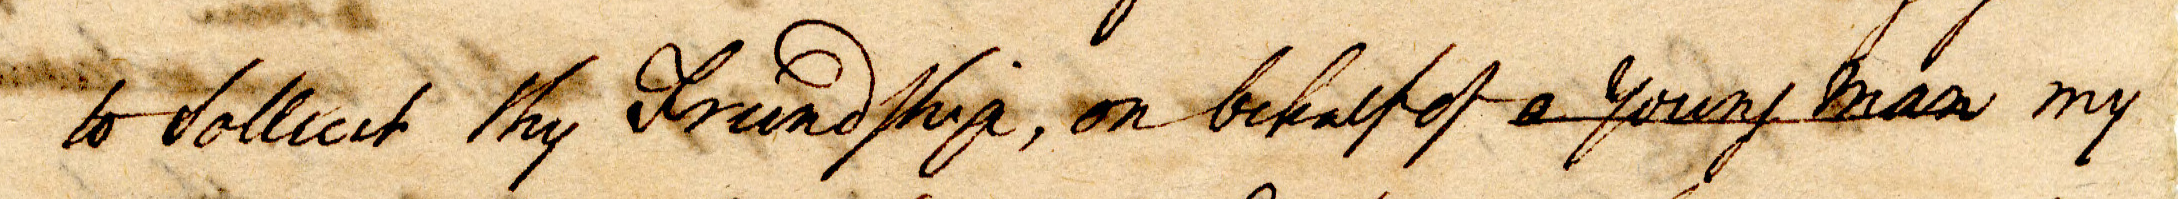to Sollicit thy Friendship, on behalf of a young man my
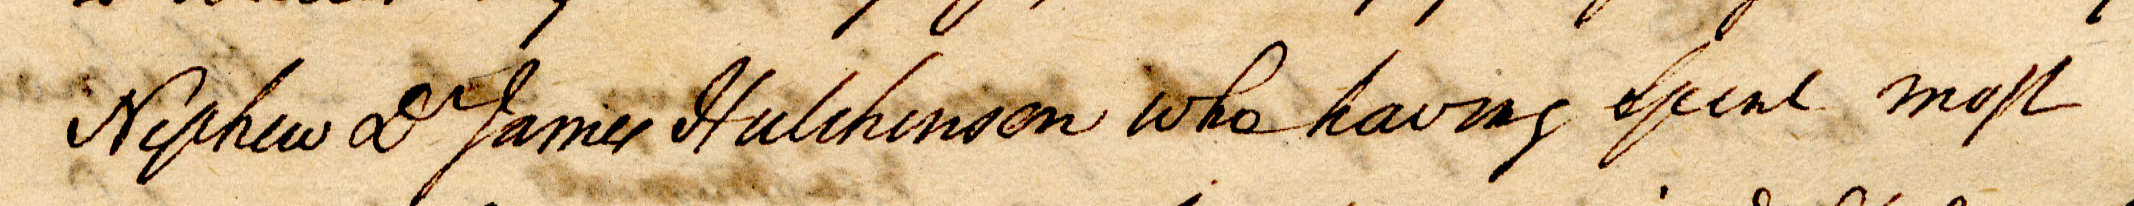Nephew D^r James Hutchinson who having spent most
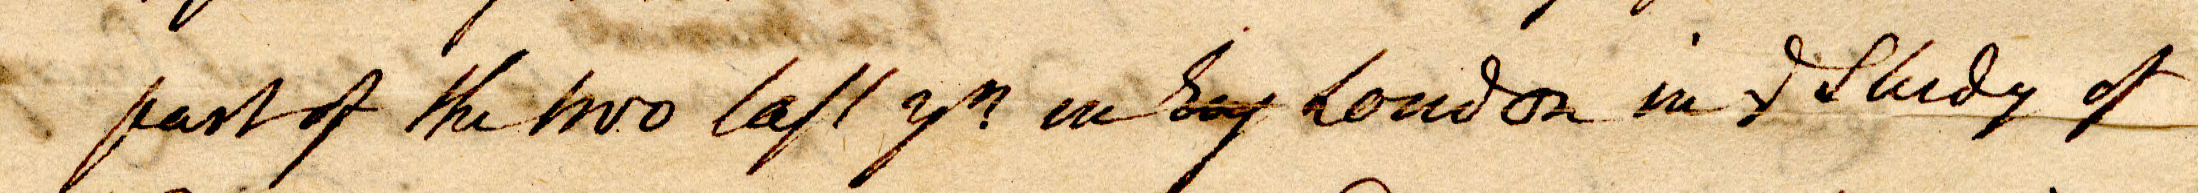part of the two last y^r. in Eng London in y^e Study of
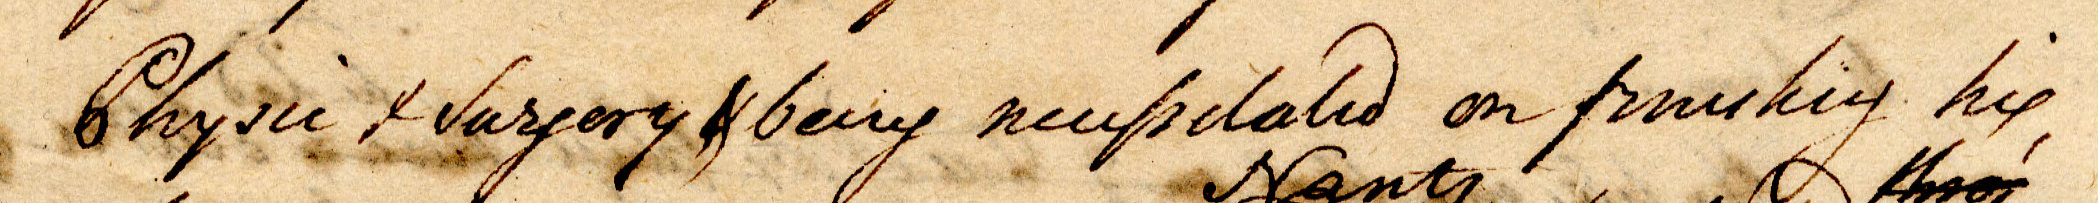Physic & Surgery & being necessitated on finishing his
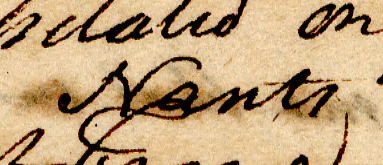Nants
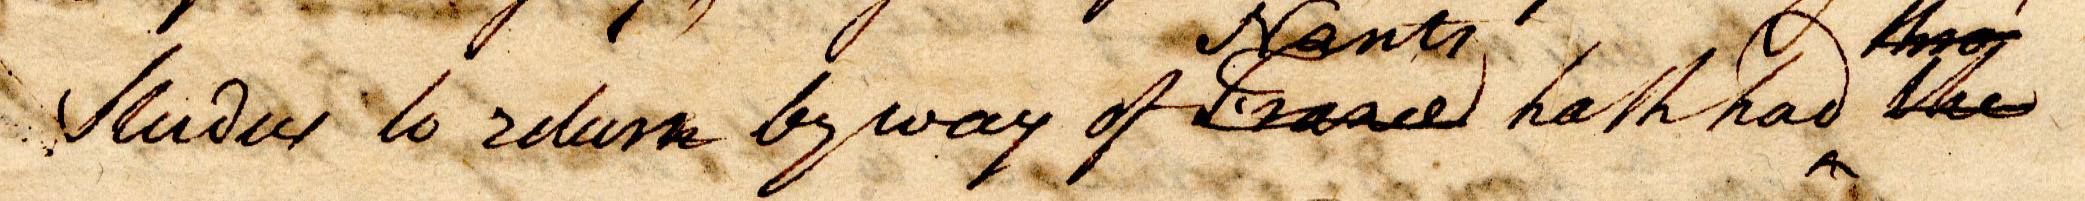Studies to return by way of [France] hath had [the]
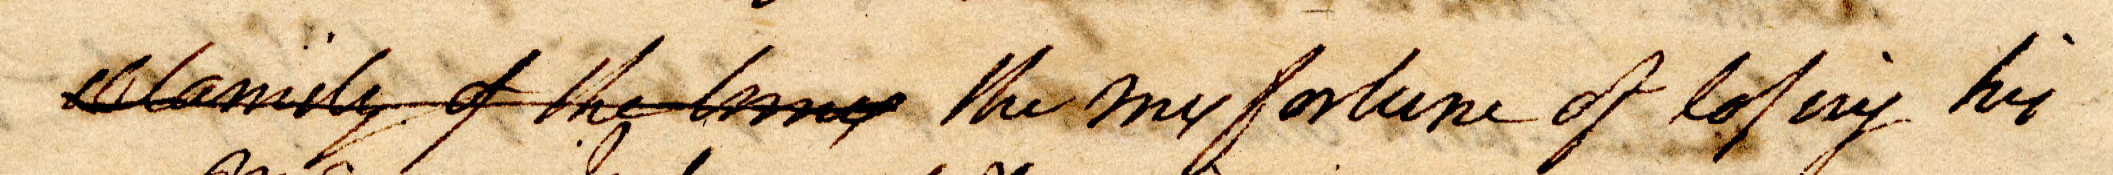[Calamity of the Imme] the misfortune of losing his
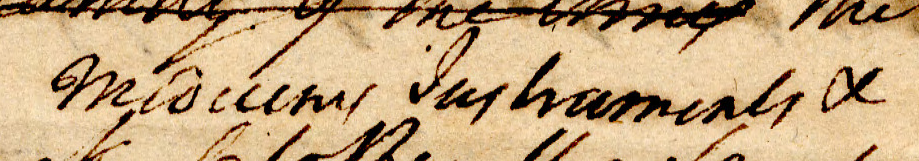medicines Instruments &
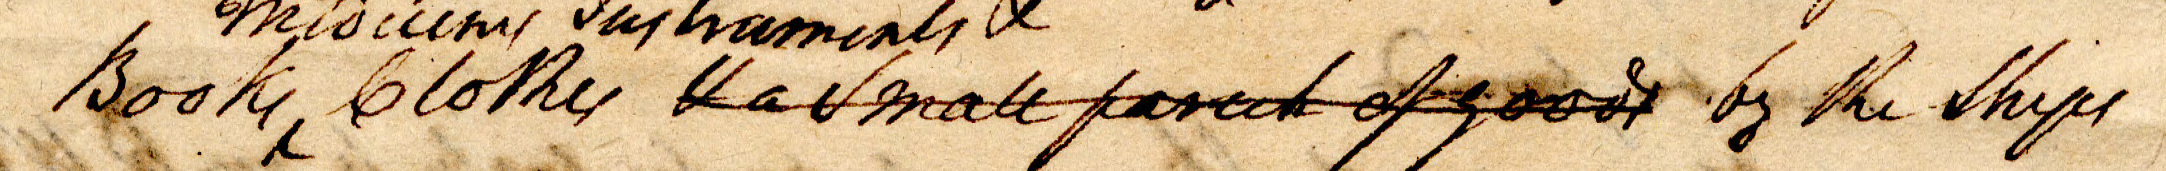Books ^ Clothes [& a small parcel of goods] by the Ships
